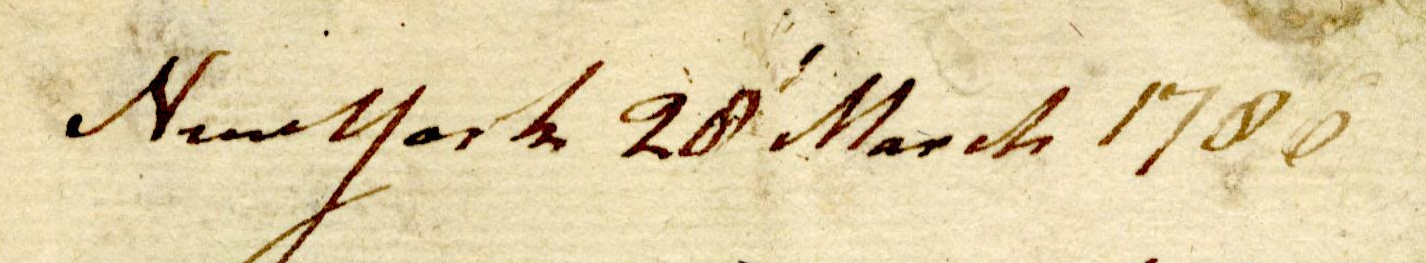New York 28^t March 1780
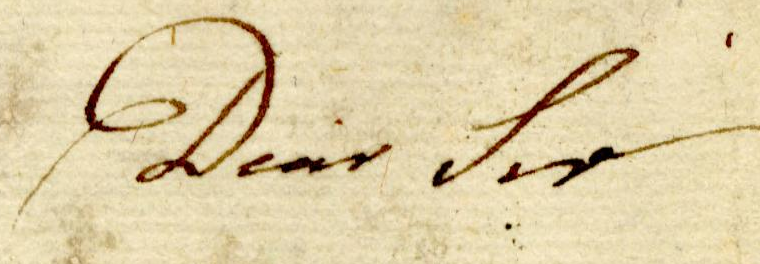Dear Sir
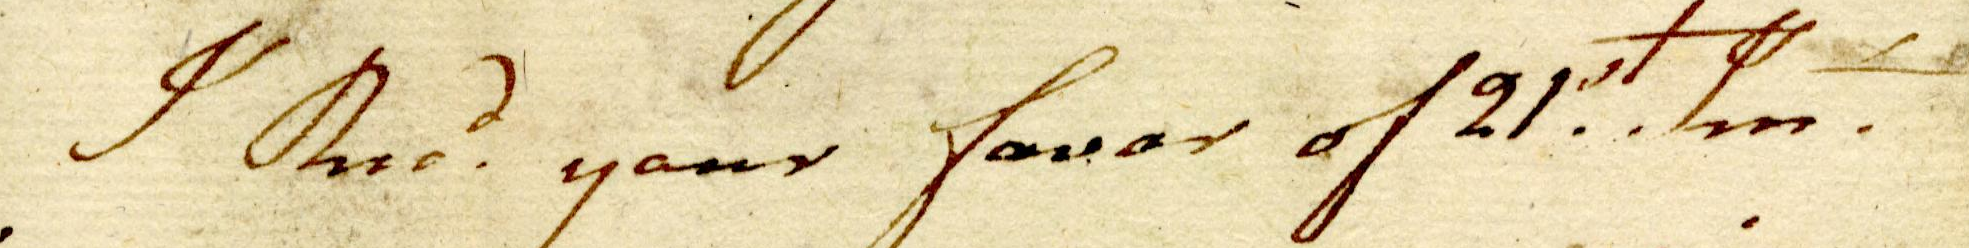I rec^d. your favor of 21^st. Ins^t.
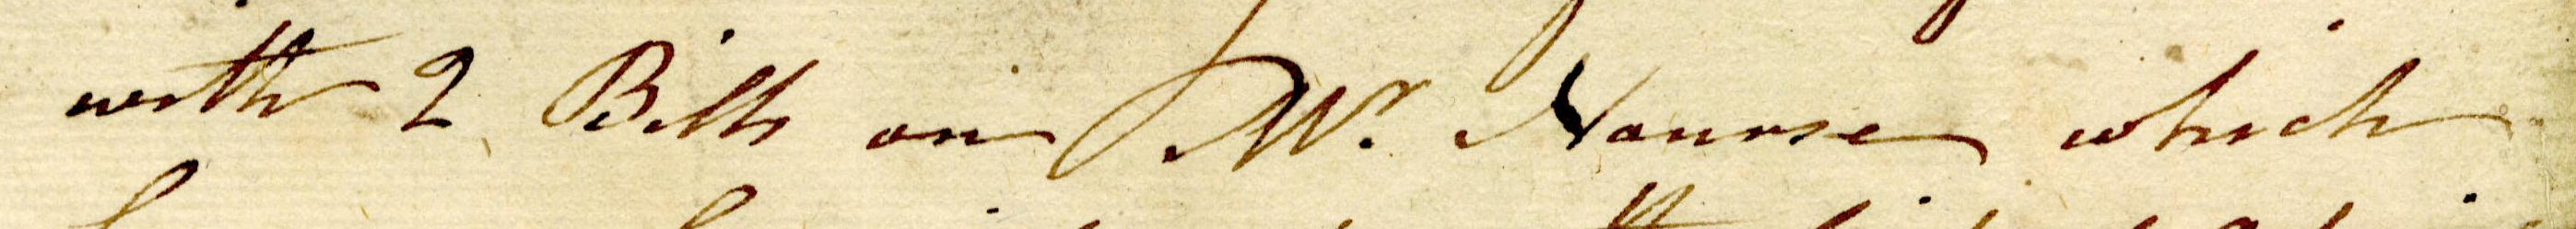with 2 Bills on M^r. Naurse which
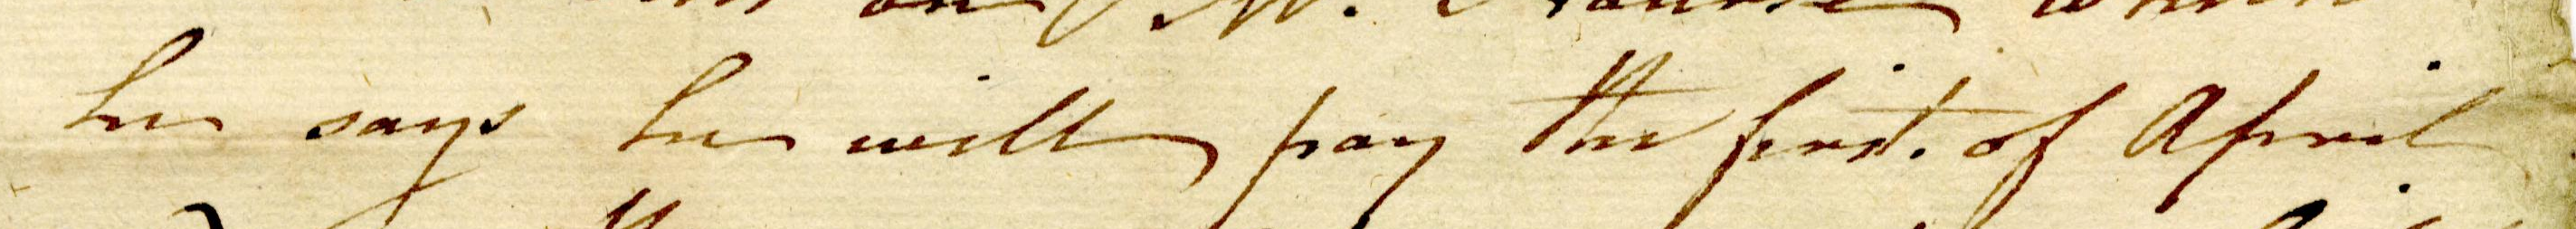he says he will pay the first of April
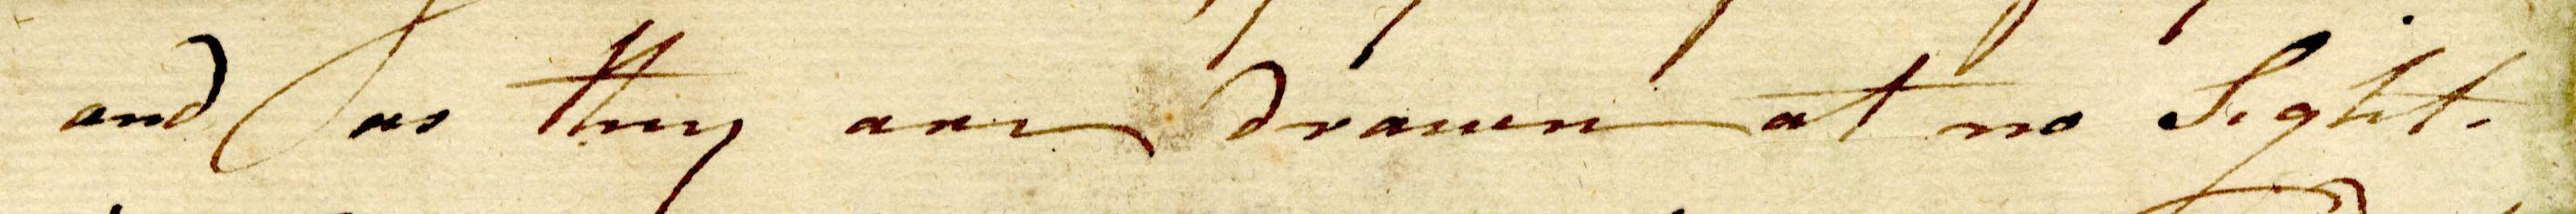and as they are drawn at no Sight
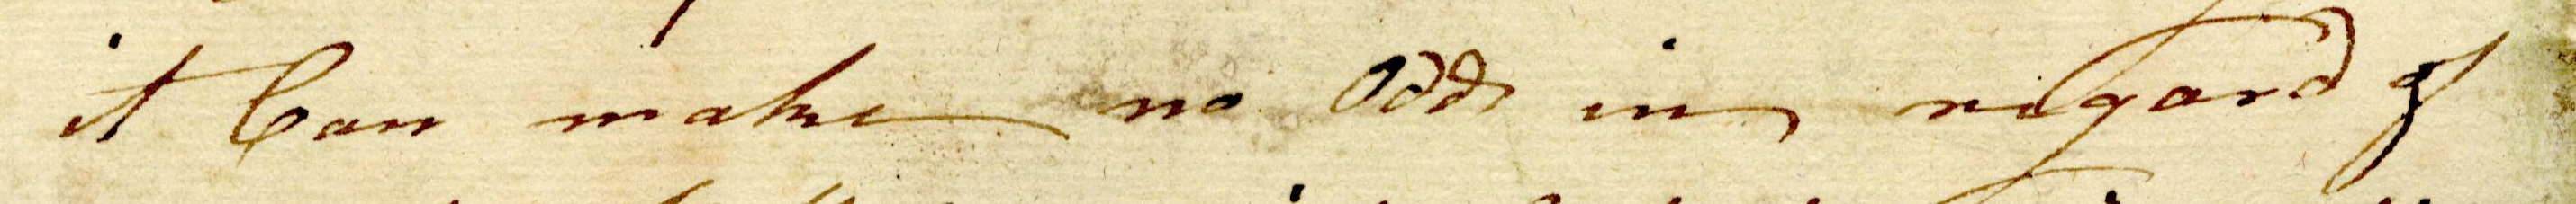it Can make no odds in regard of
